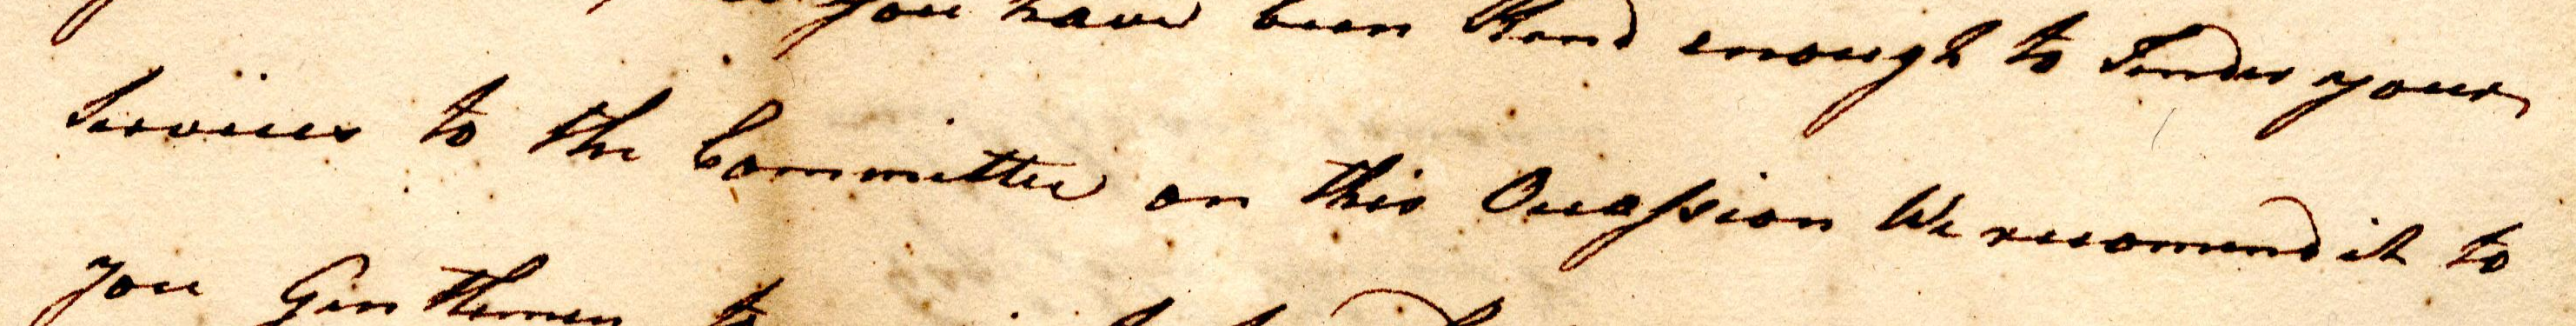service to the Committee on this Occassion We recomend it to
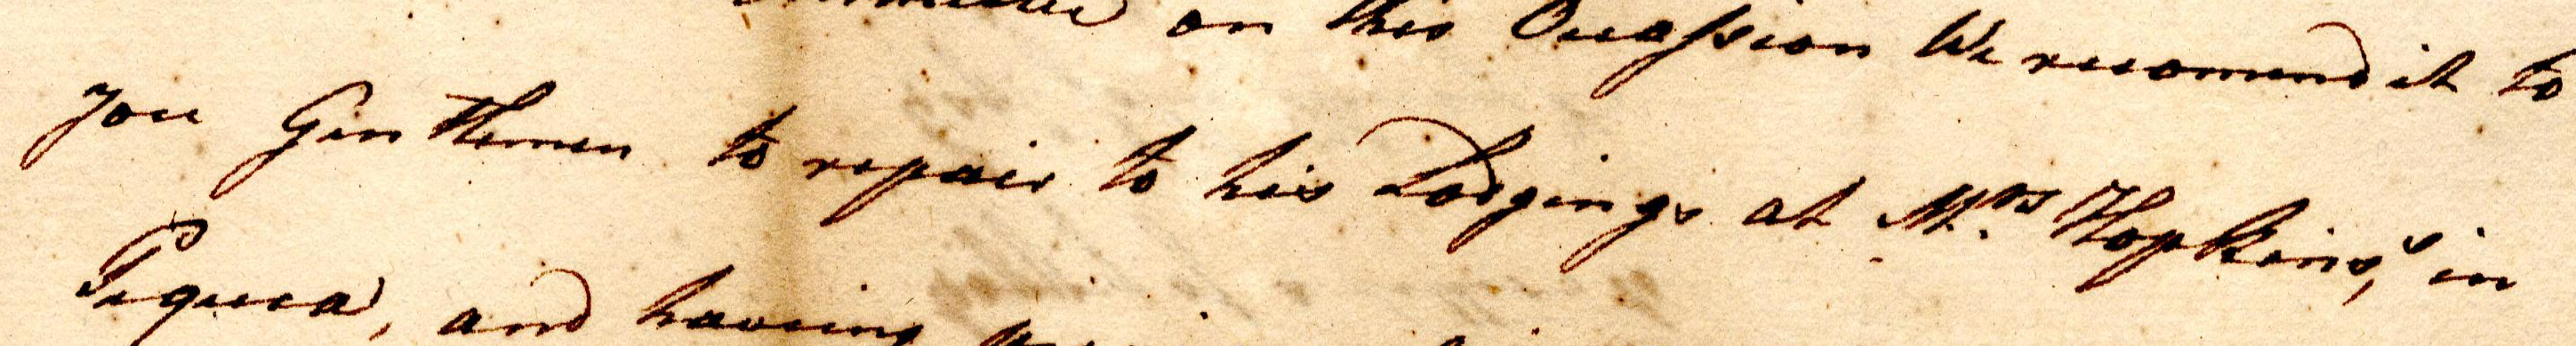you Gentlemen to repair to his Lodgings at M^rs. Hopkins^s, in
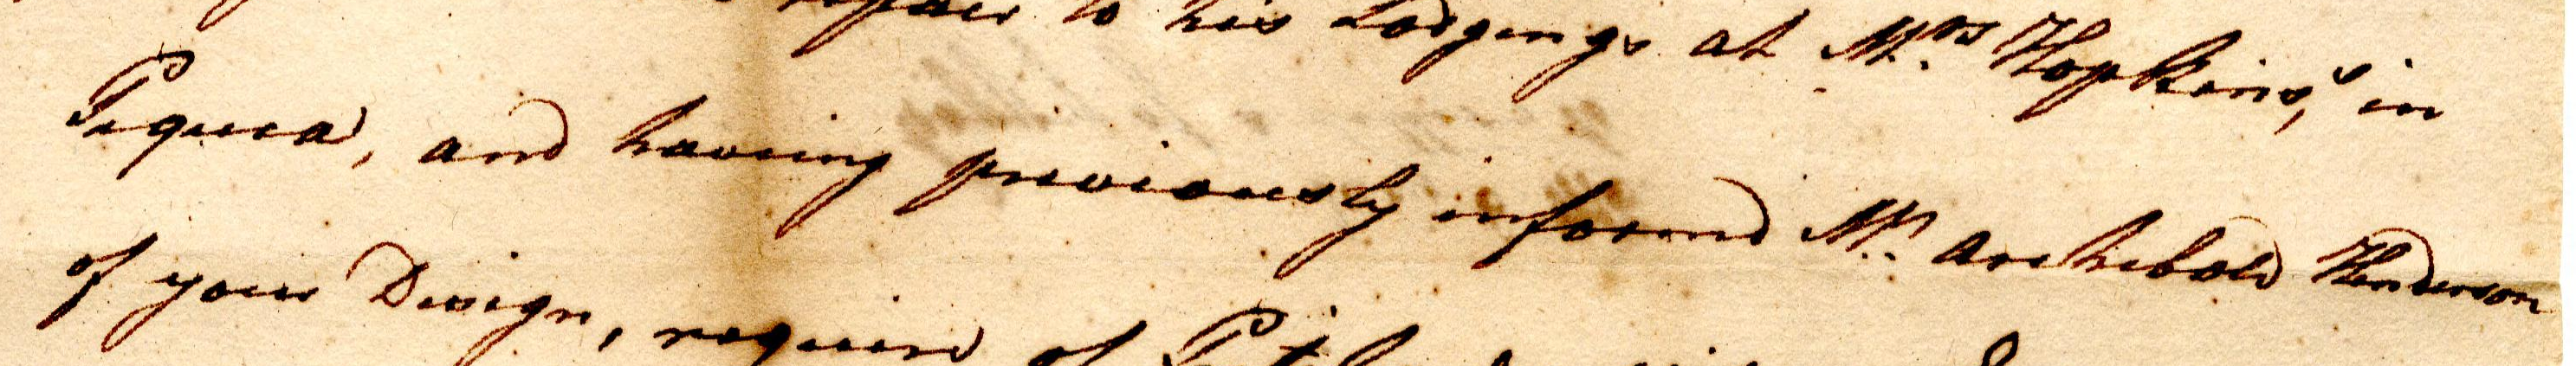Pequea, and having previously inform'd M^r. Archibold Henderson
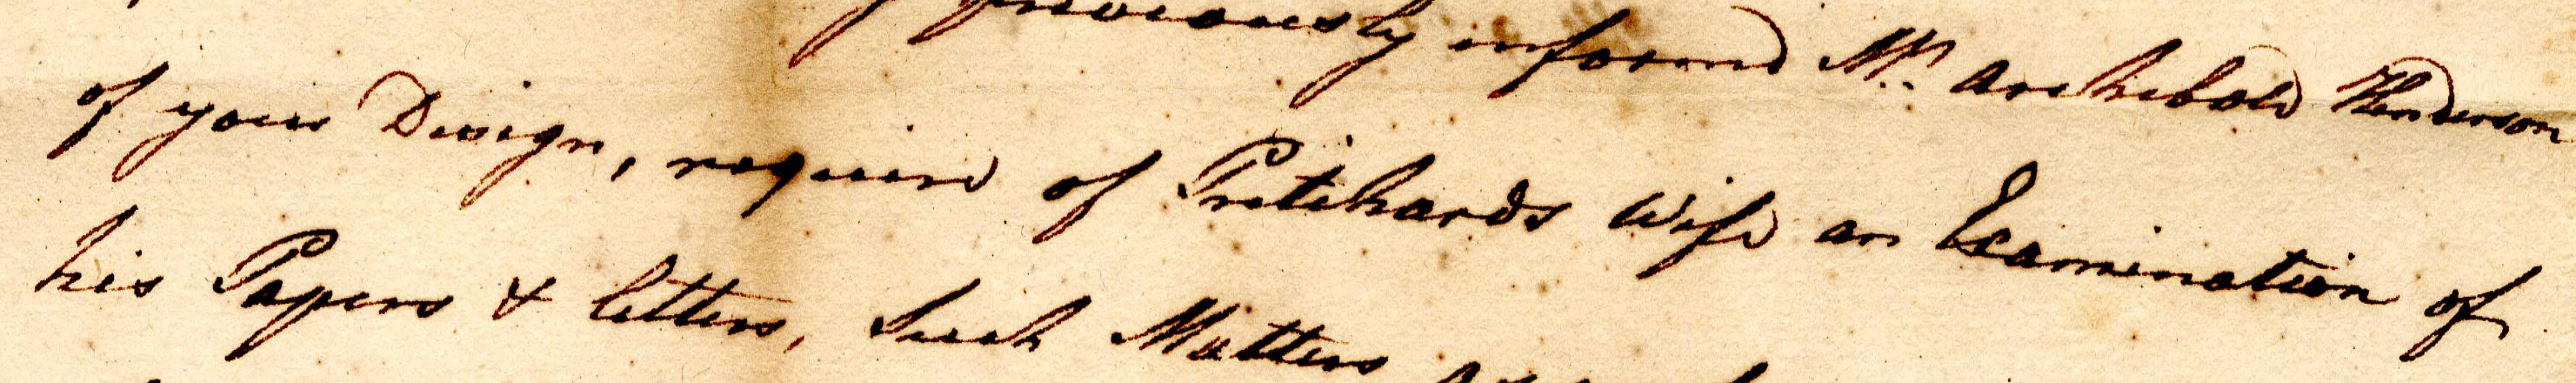of your Design, require of Pritchards Wife an Examination of
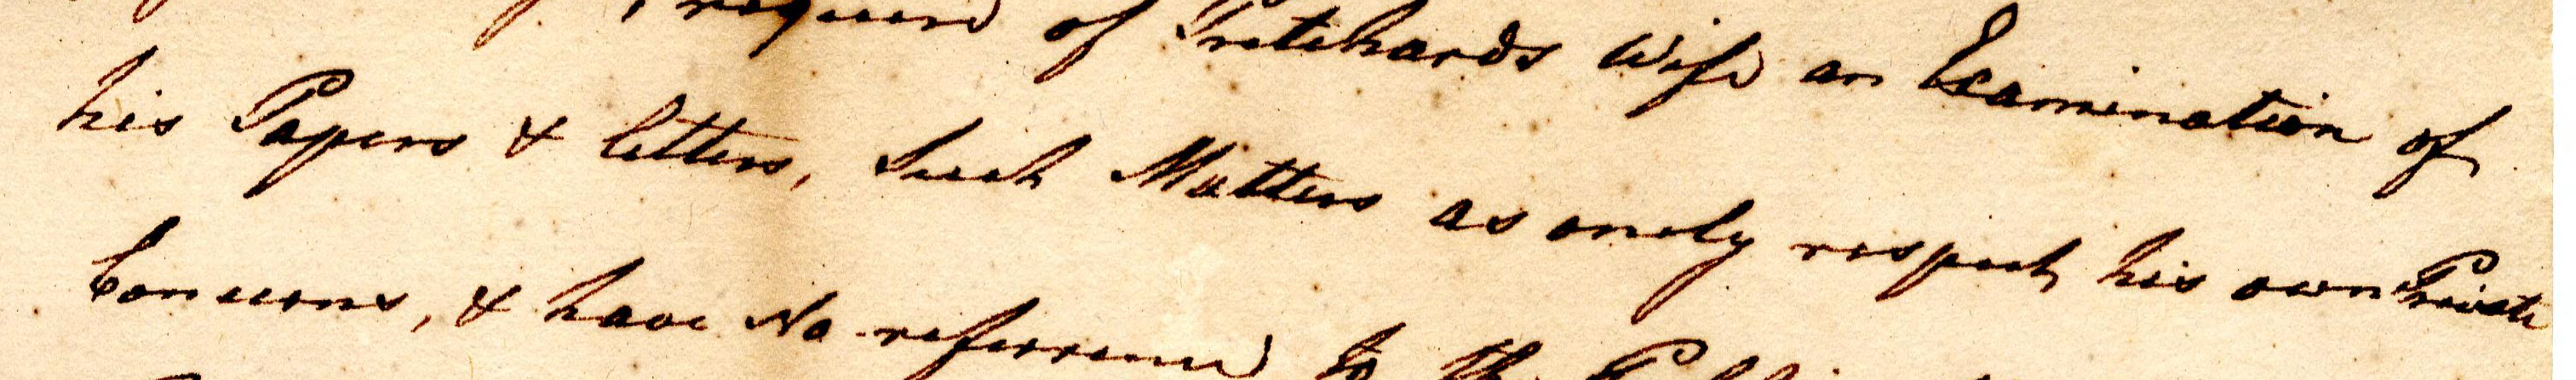his Papers & letters, Such Matters as only respect his own Private
